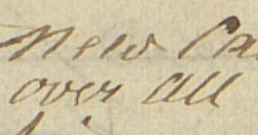over all
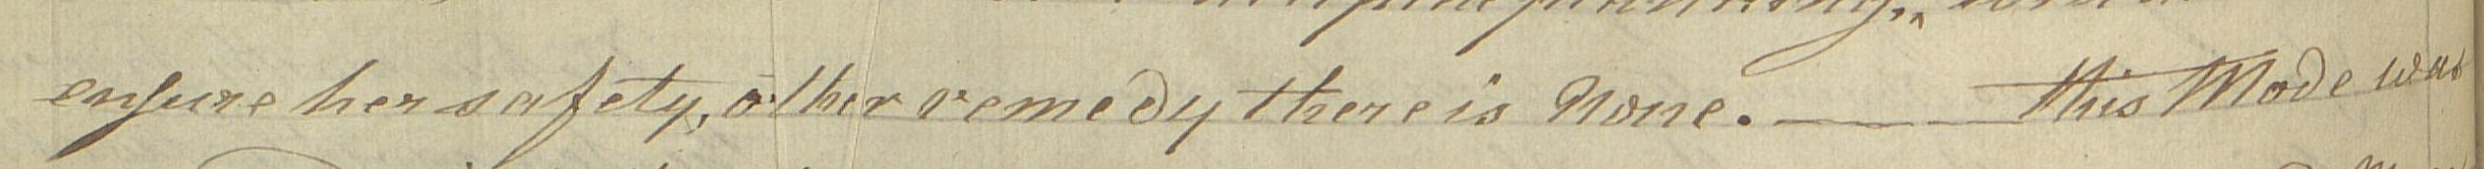ensure her safety, other remedy there is None. This Mode was
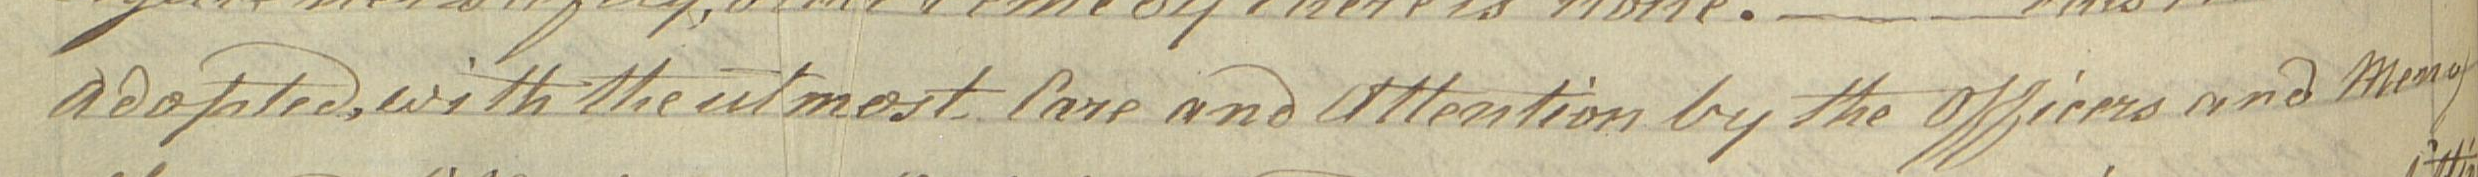adopted, with the utmost Care and Attention by the officers and Men of
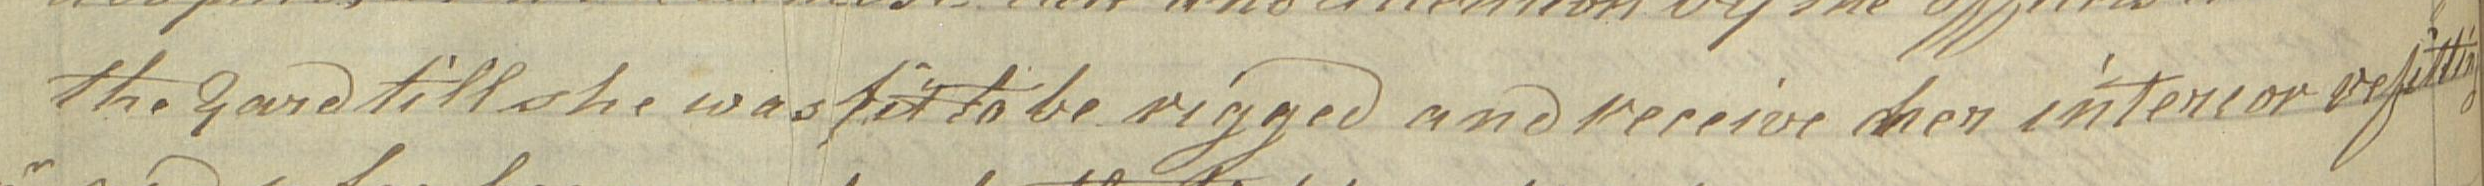the Yard till she was fit to be rigged and receive her interior refitting
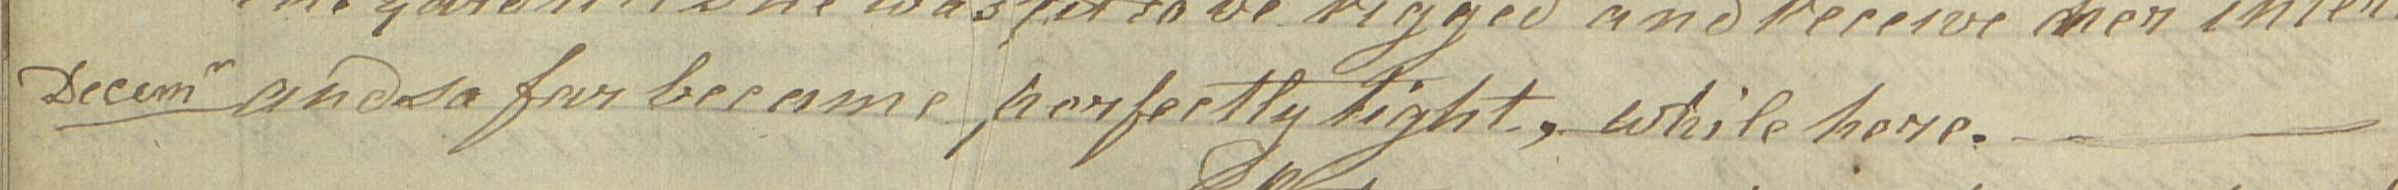Decem^r and so far became perfctly light, while here.
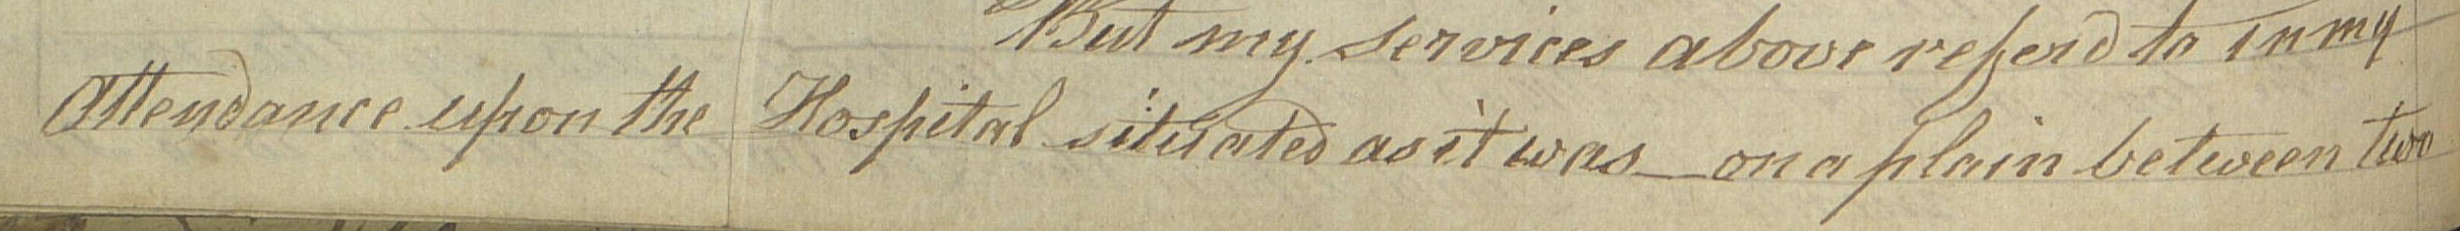Attendance upon the Hospital situated as it was on a plain between two
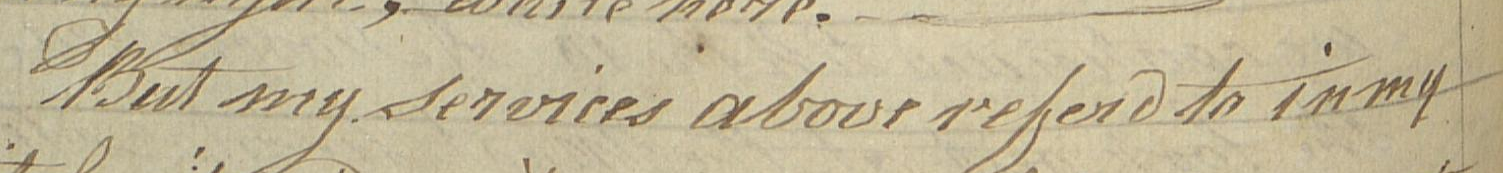But my services above referd to in my
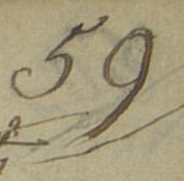59
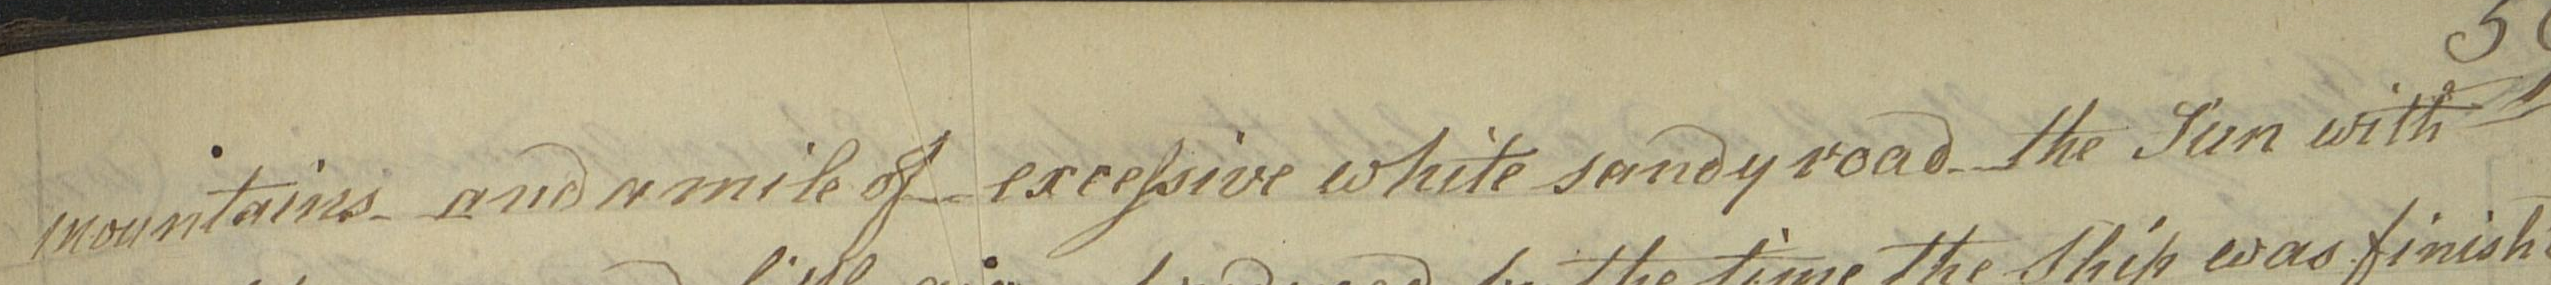mountains and a mile of excessive white sandy road the sun with
